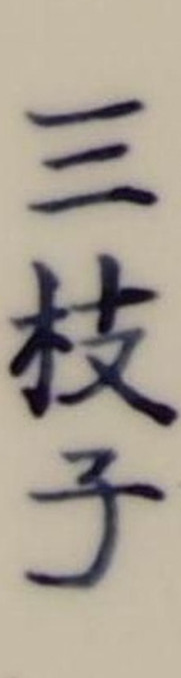三枝子
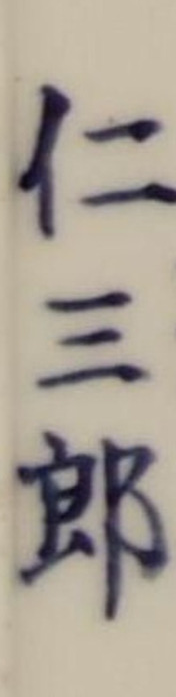仁三郎

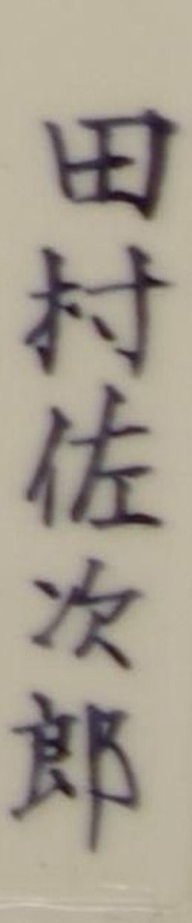田村佐次郎
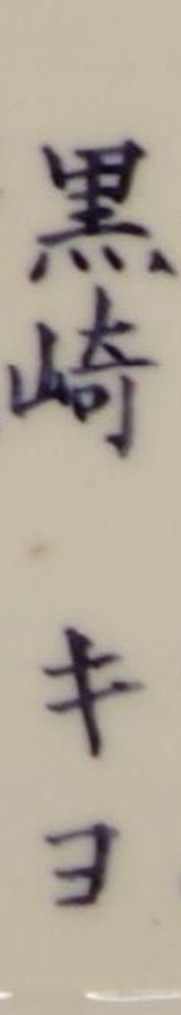黒崎キヨ
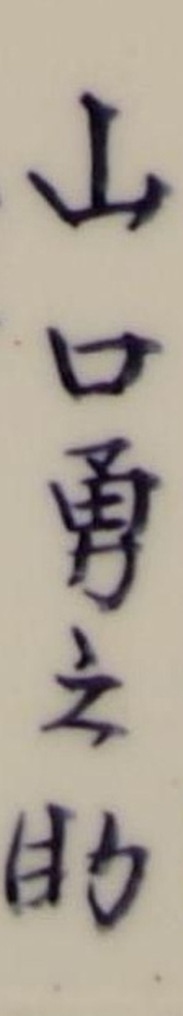山口勇之助
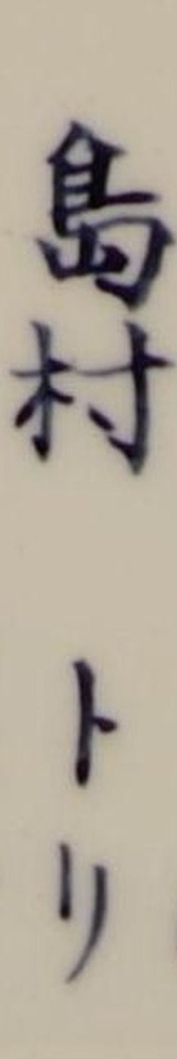島村トリ
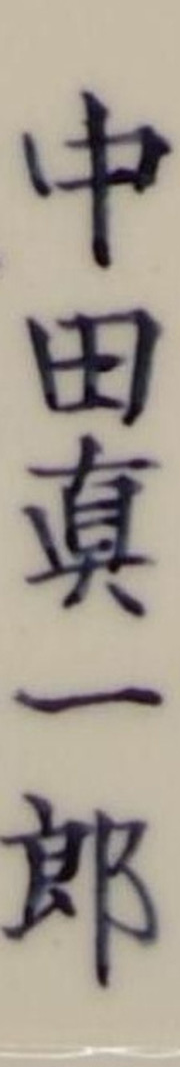中田真一郎
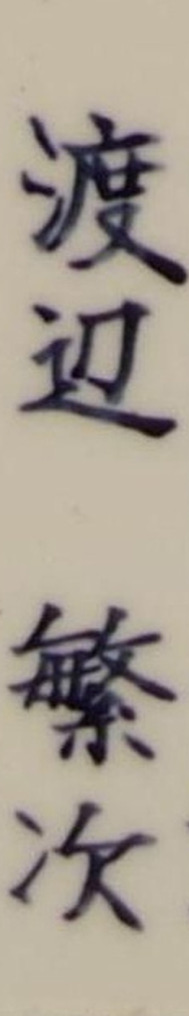渡辺繁次
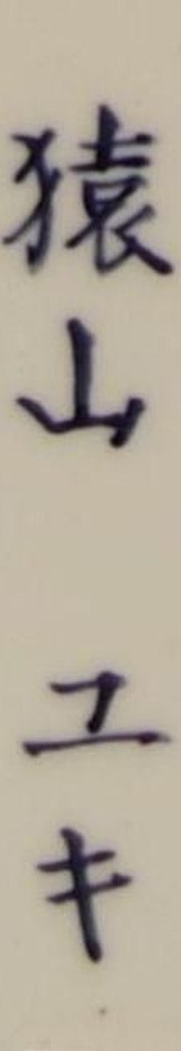猿山ユキ
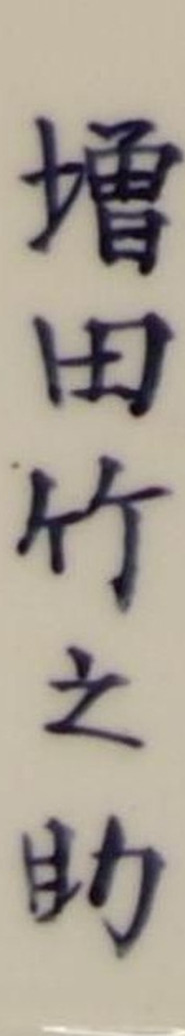増田竹之助
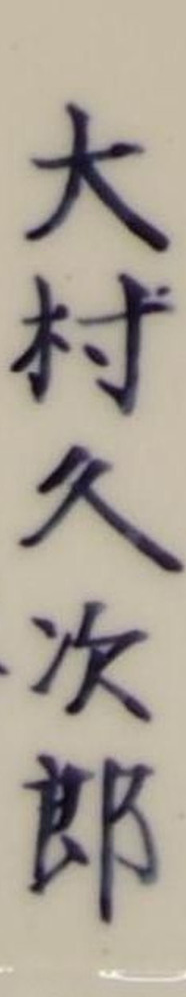大村久次郎
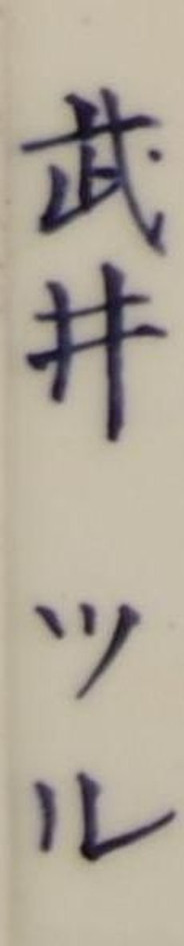武井ツル

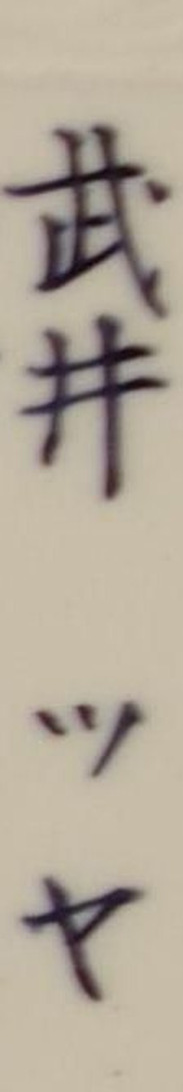武井ツヤ
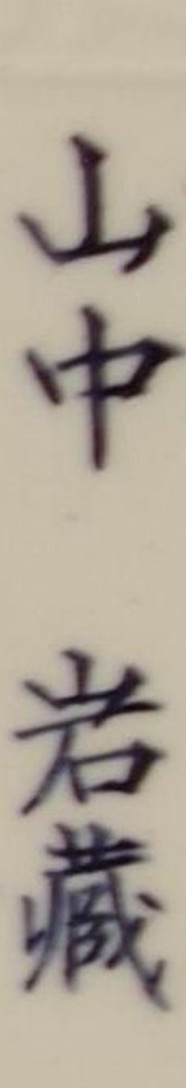山中岩蔵
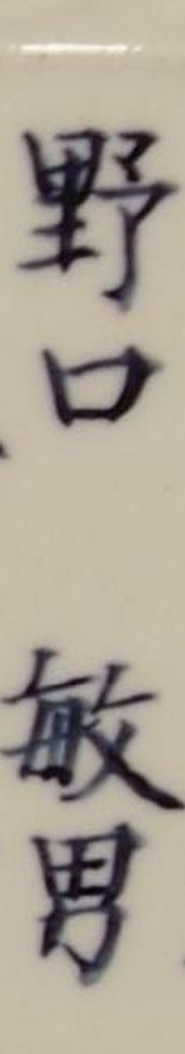野口敏男
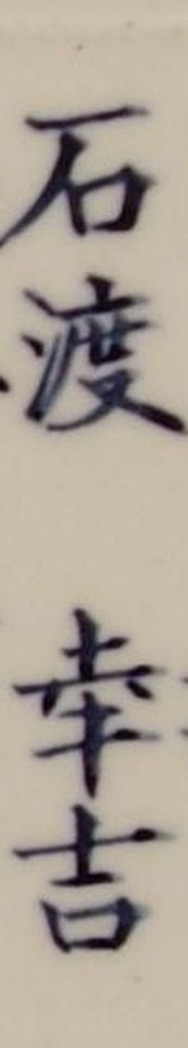石渡幸吉
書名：E~L
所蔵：高野山金剛峯寺
